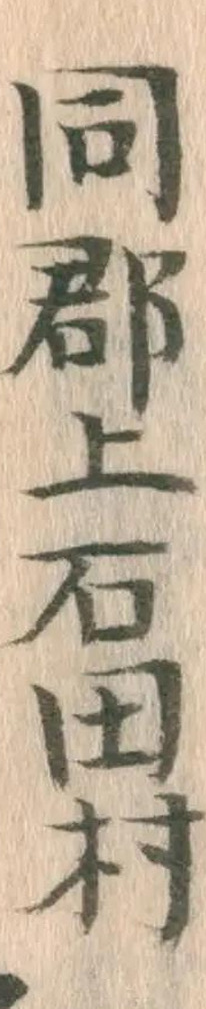同郡上石田村
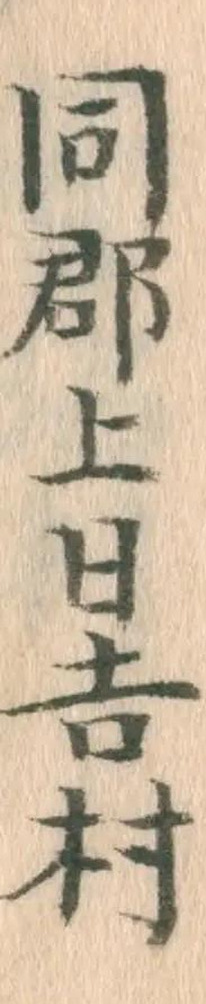同郡上日吉村

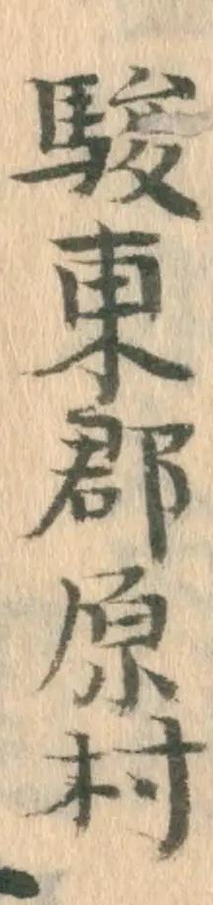駿東郡原村
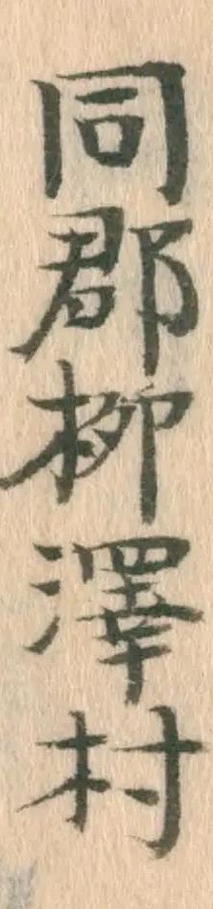同郡柳沢村
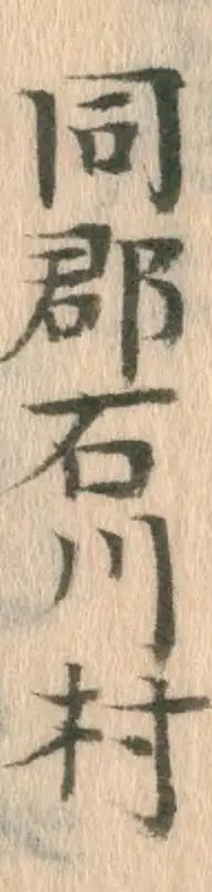同郡石川村
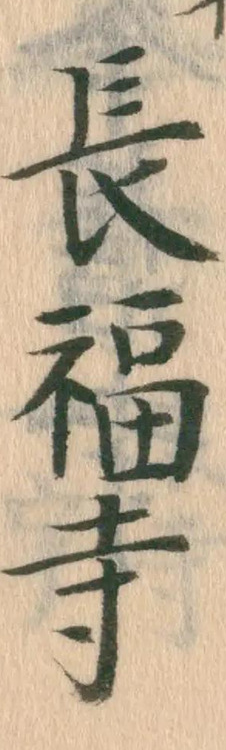長福寺
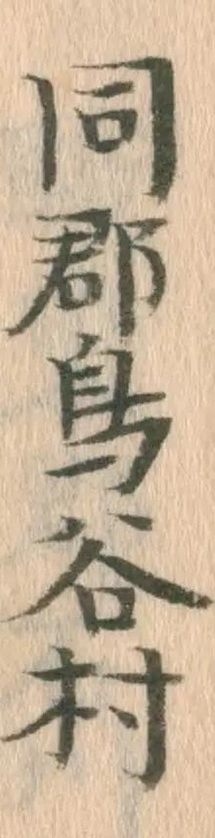同郡柳沢村
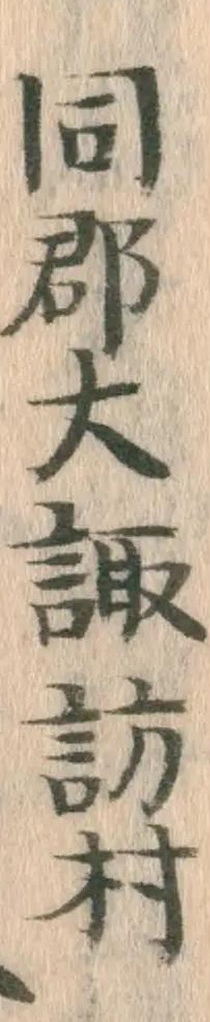同郡大諏訪村
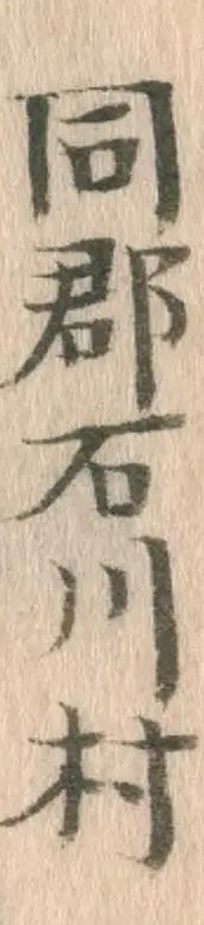同郡石川村
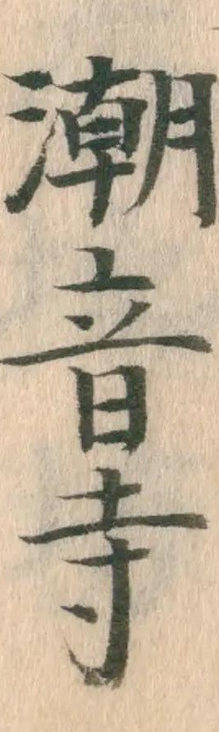潮音寺

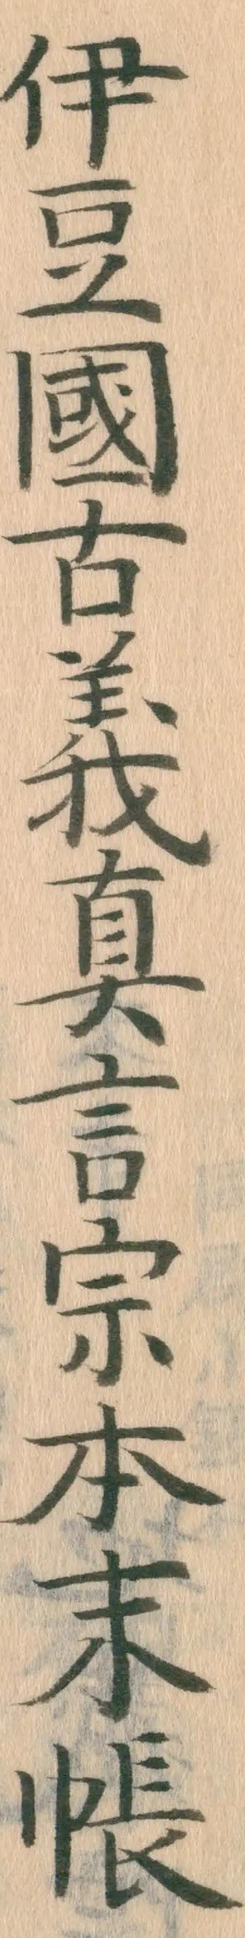伊豆国古義真言宗本未帳
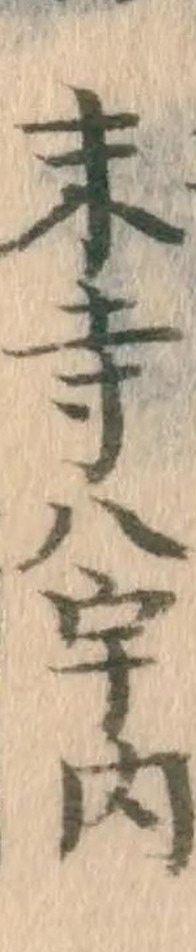見寺八宇内
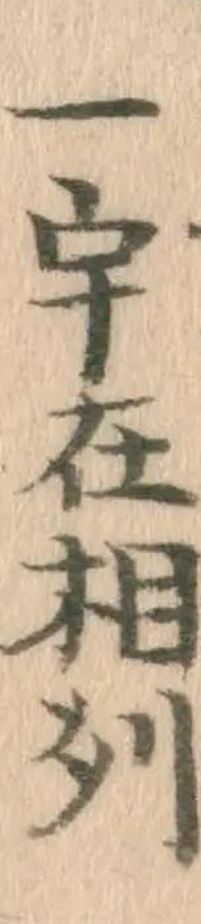一宇在相州
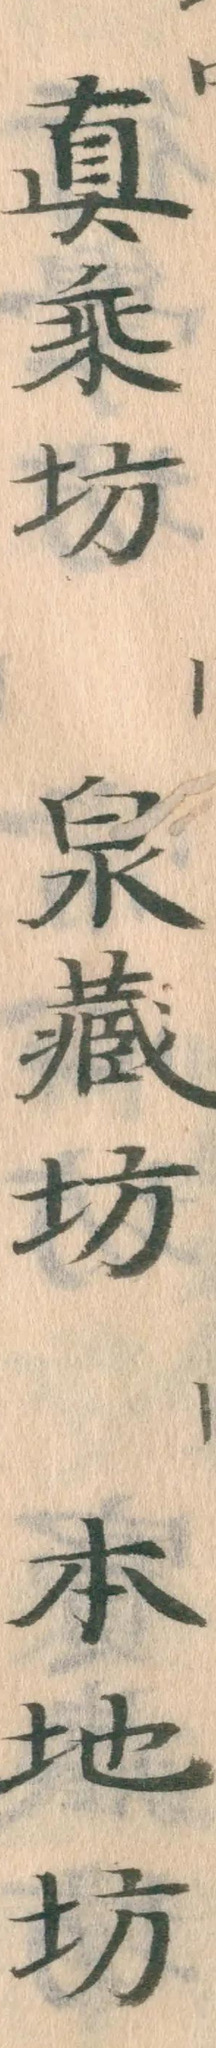真乗坊泉蔵坊本地坊
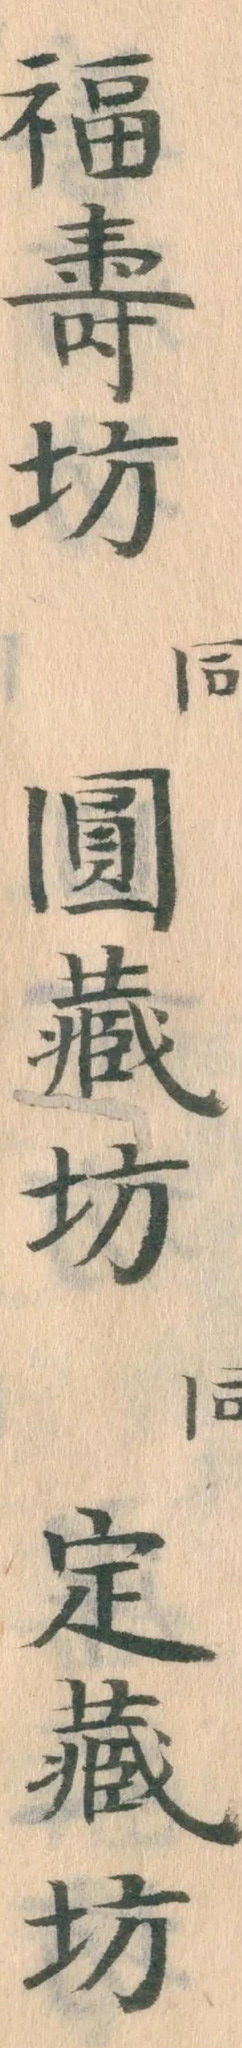福寿坊圓蔵坊定蔵坊

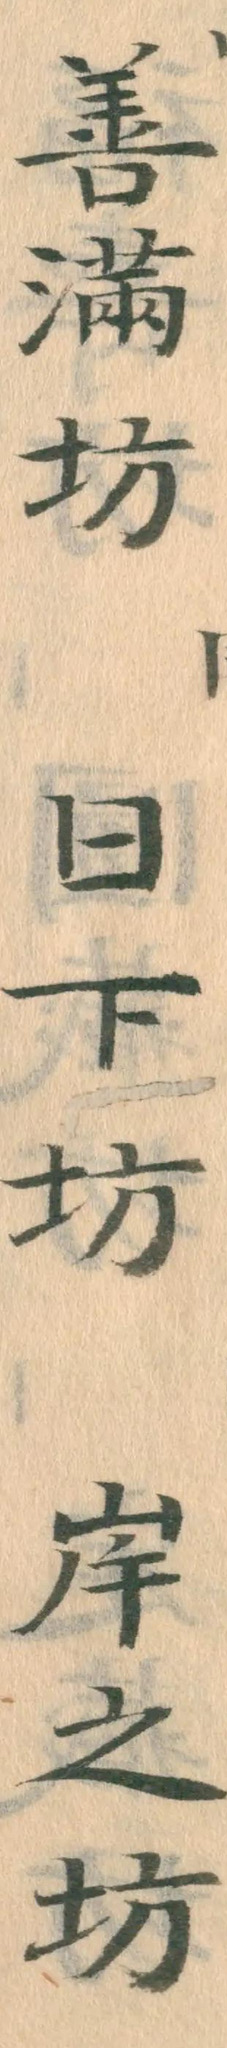善満坊日下坊岸之坊
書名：古義真言宗本末帳 21巻. [4] 第三 伊賀国、伊勢国、志摩国、尾張国、三河国、遠江国、駿河国、伊豆国、甲斐国
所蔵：国立国会図書館 National Diet Library, JAPAN
